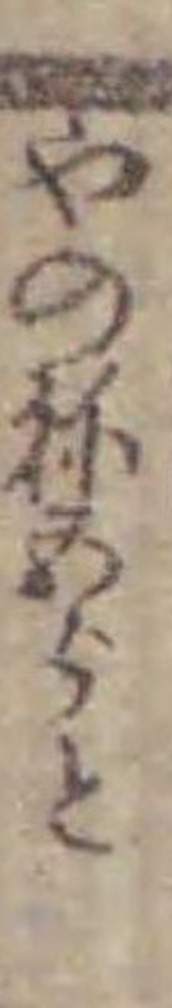やのね五郎と
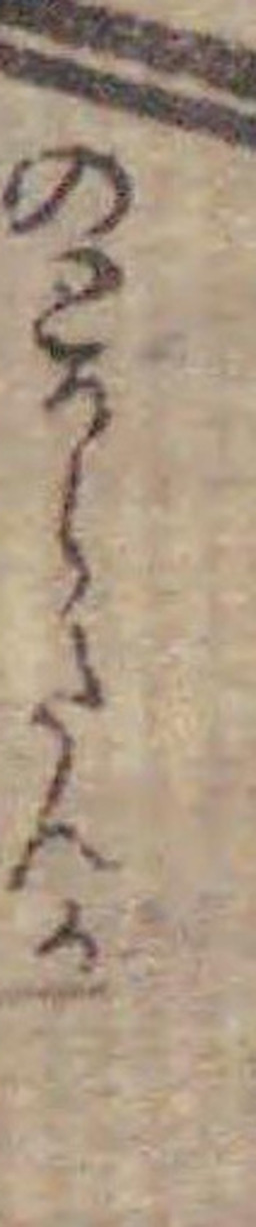のとからたんか
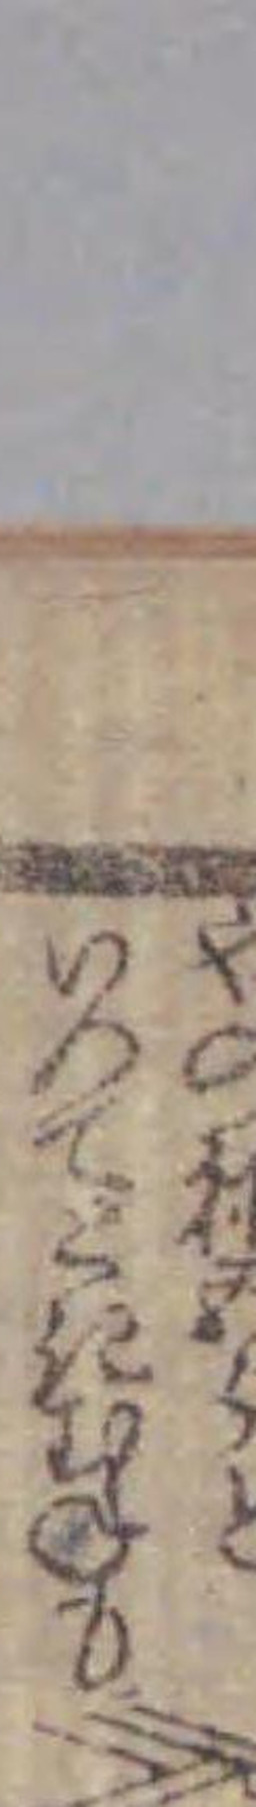いつてときむねも
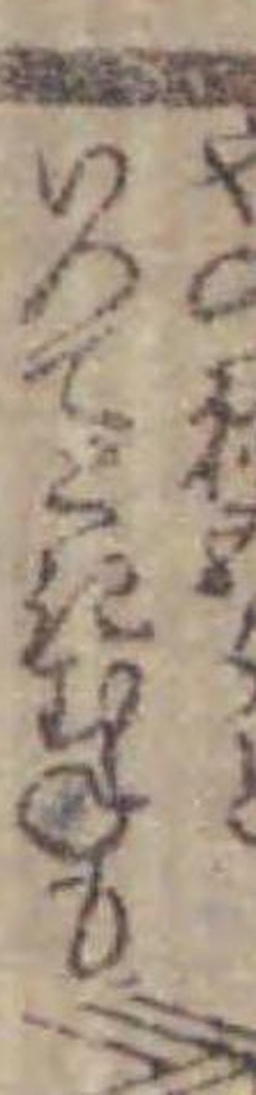いつてときむねも
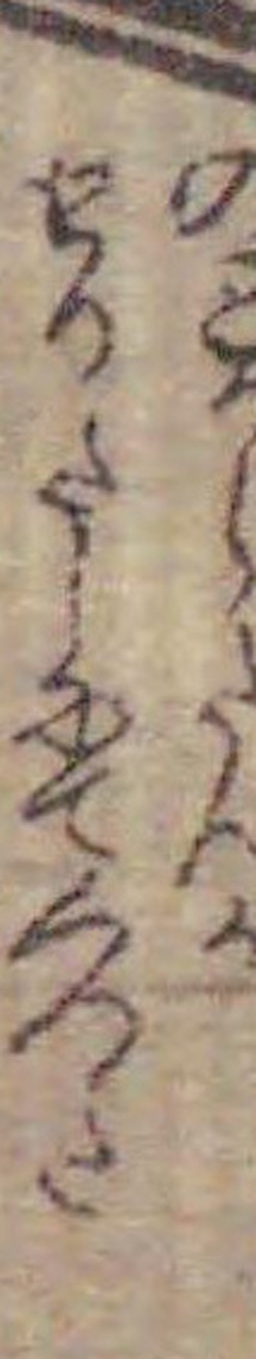せりたしにてくつた
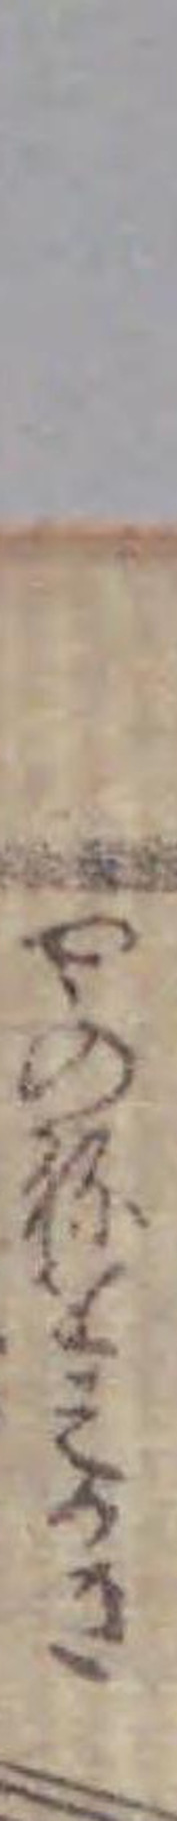やのねをみかき
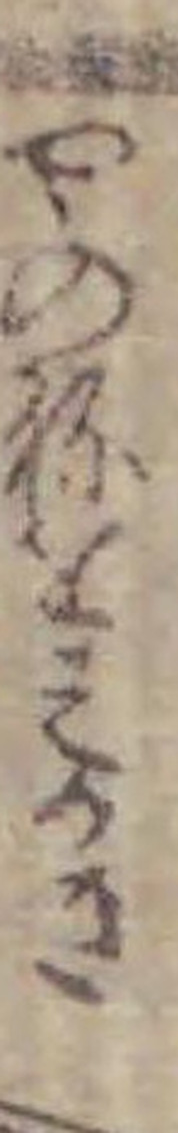やのねをみかき
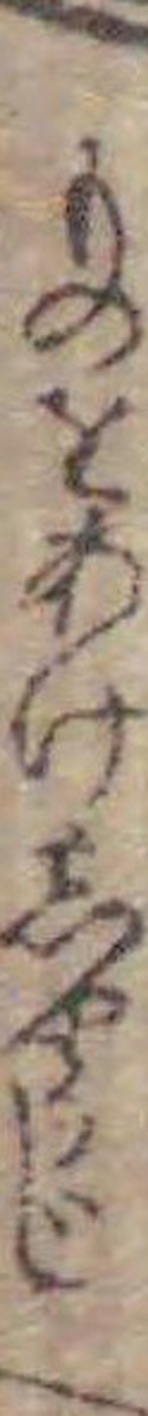ものをあけしやうじ
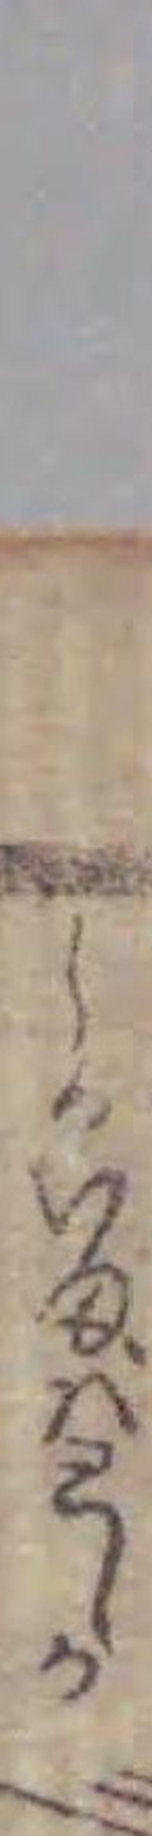しかいまはとしか
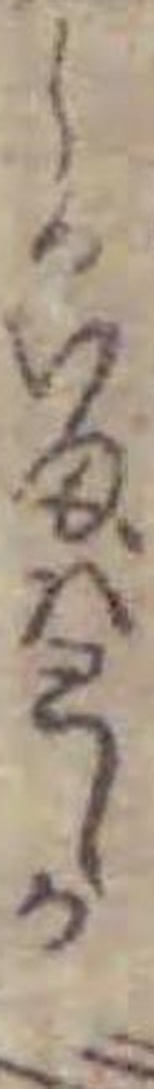しかいまはとしか
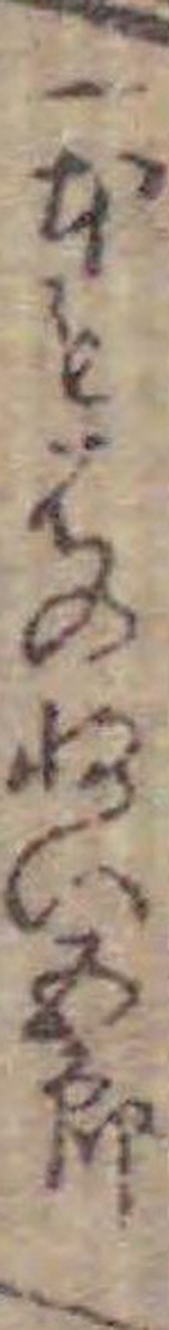一本もはのねい五郎
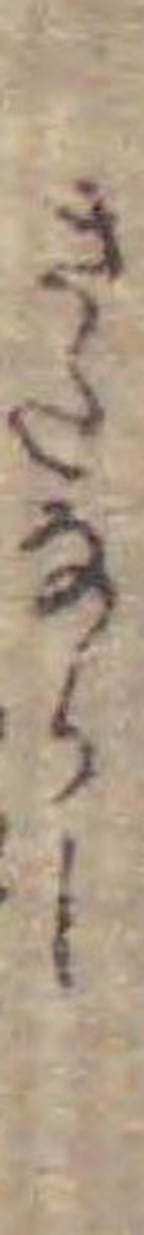きたならし
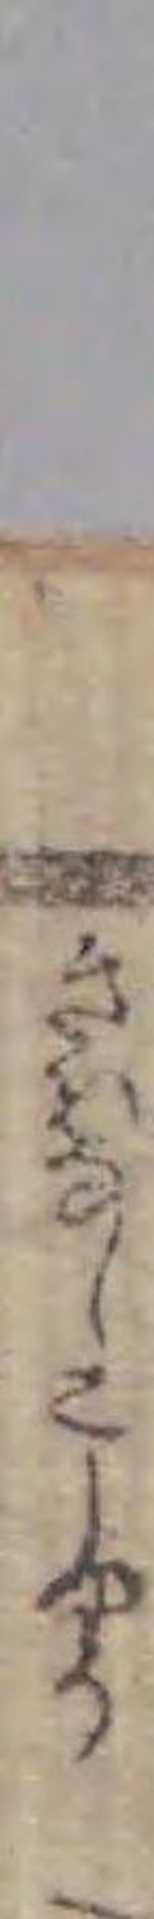きはなしこしやう
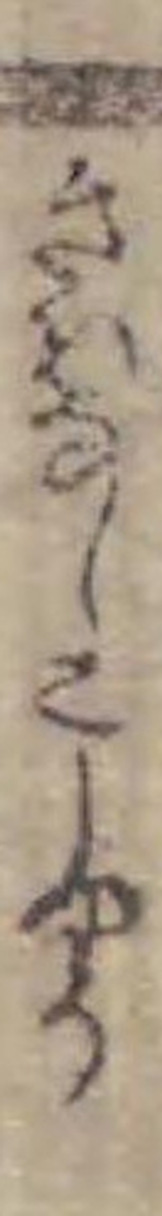きはなしこしやう
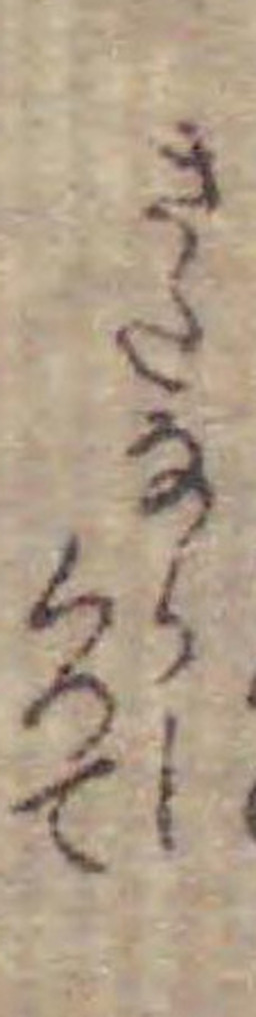くつて
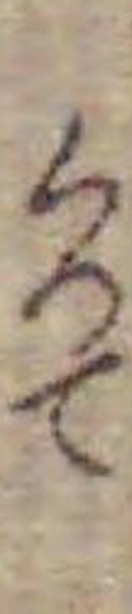くつて
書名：年寄之冷水曽我 : 3巻
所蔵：国立国会図書館 National Diet Library, JAPAN
